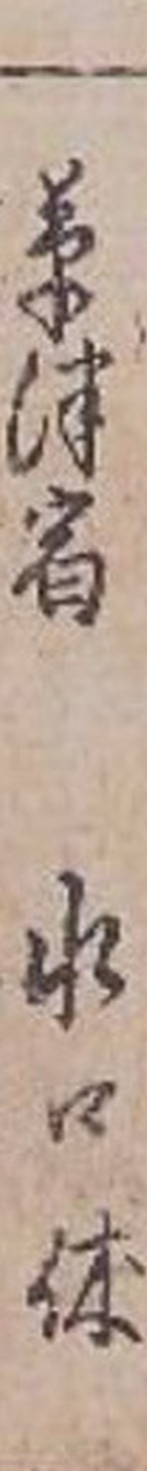草津宿水口休
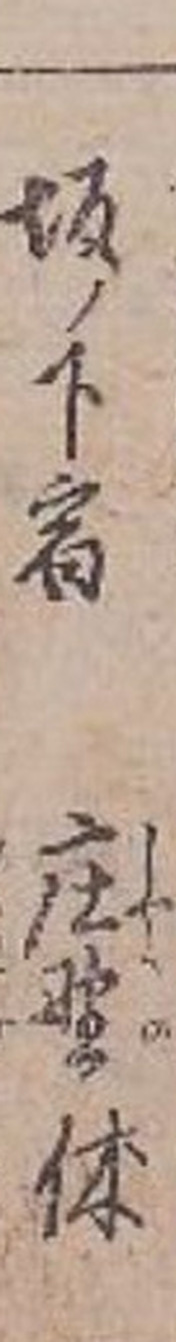坂ノ下宿庄野休

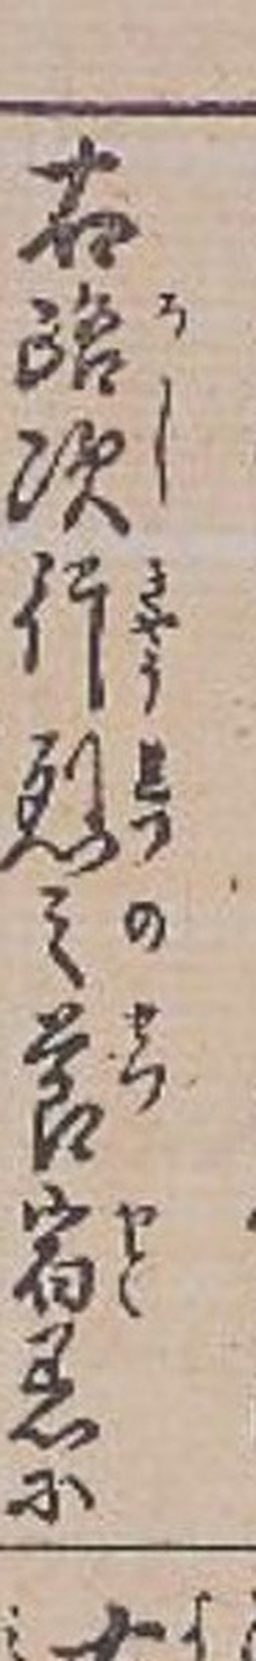右路次行烈の節宿着に
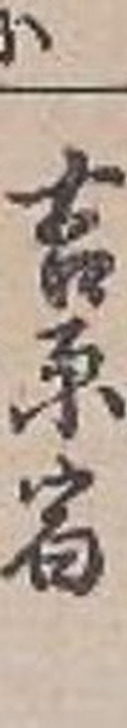吉原宿
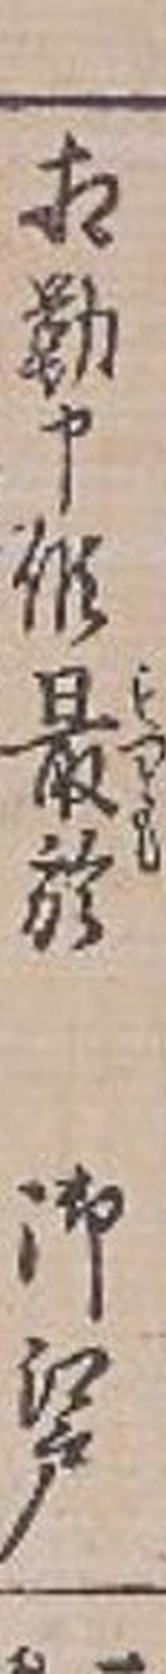相勤申但最於御江戸
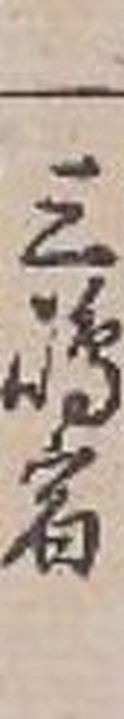三嶋宿
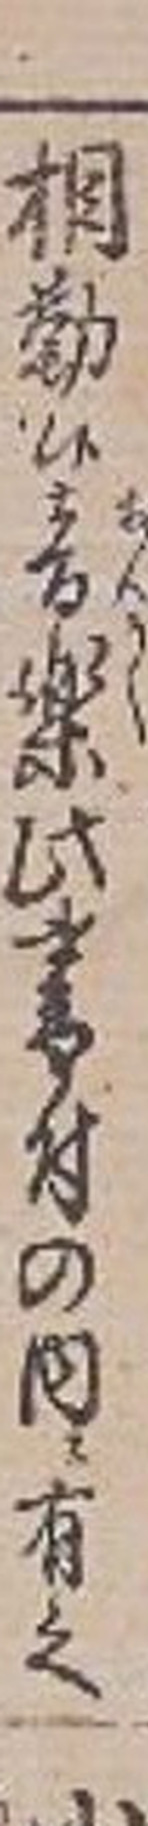相勤候音楽の書付の内有之
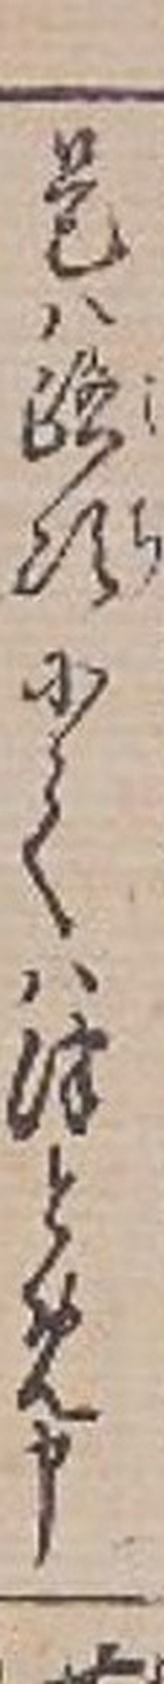是は路次にてはつとめ申
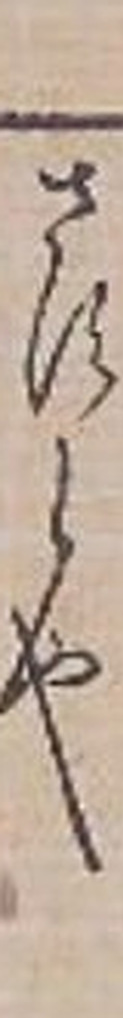さすとや
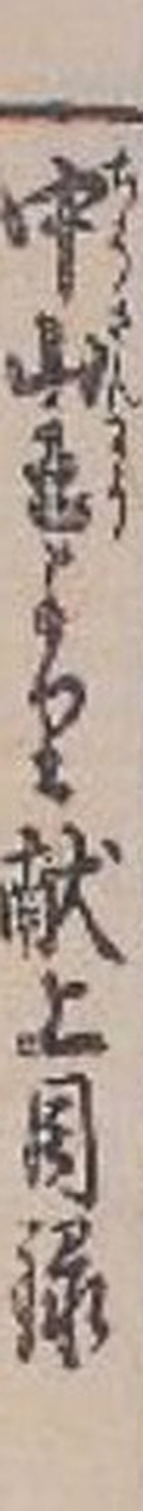中山王より献上目録
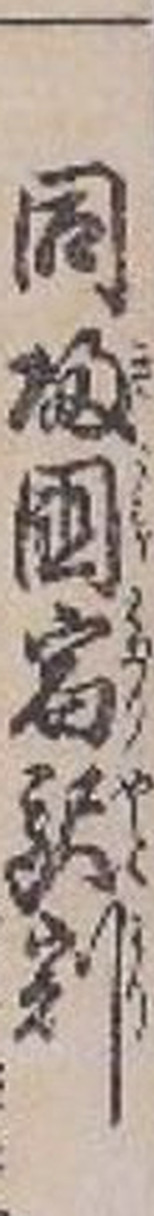同帰国宿驛割
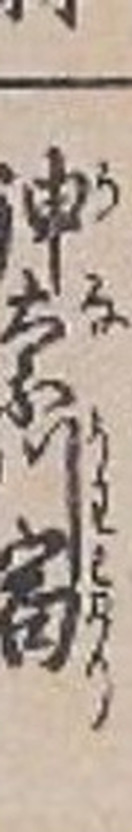神奈川宿
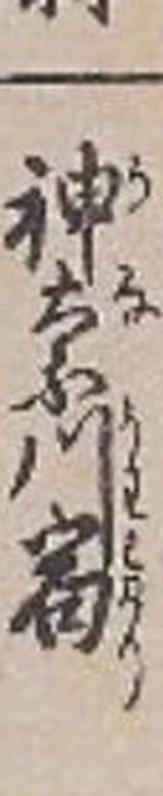神奈川宿
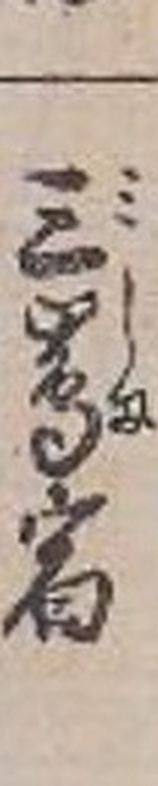三嶋宿
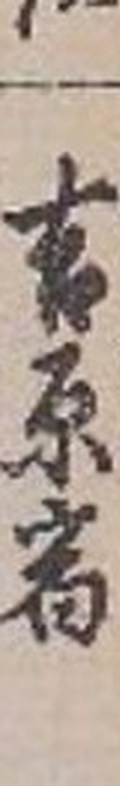吉原宿
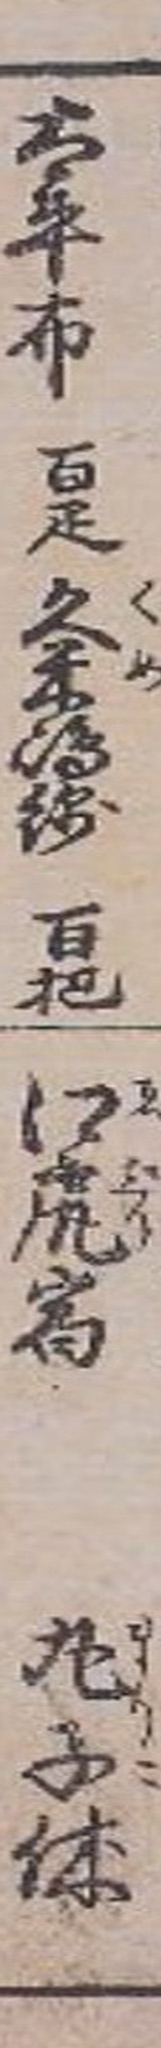太平布百疋久米嶋綿百把
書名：琉球人大行列記 大全 来朝新板絵入
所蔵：University of the Ryukyus Library
